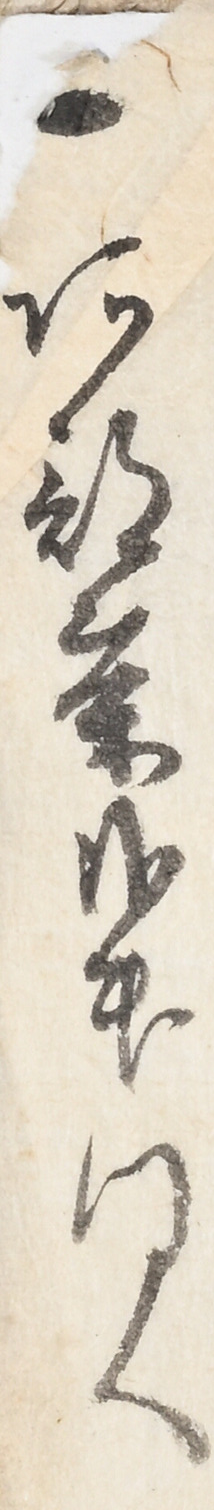一阿部茶弐升同人

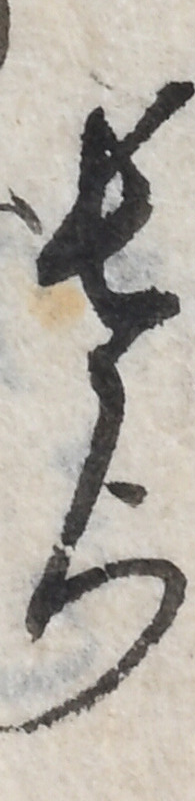太右衛門
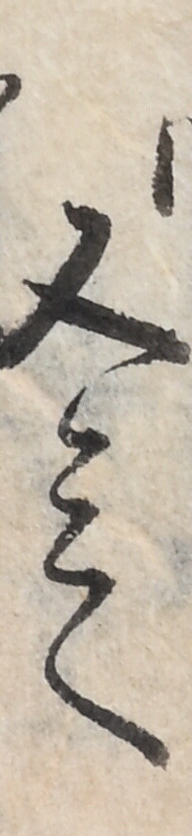利兵衛
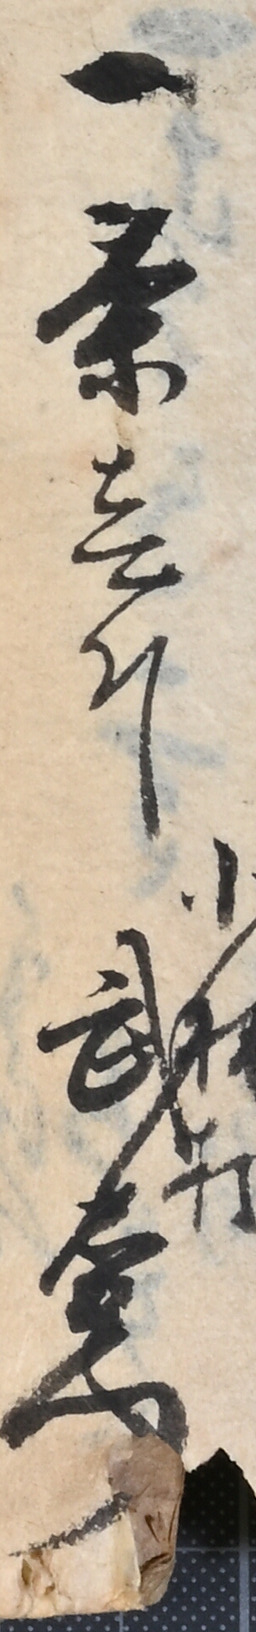一酒樽武右衛門
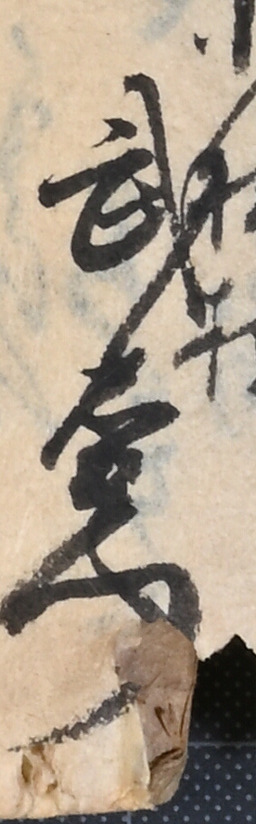太右衛門
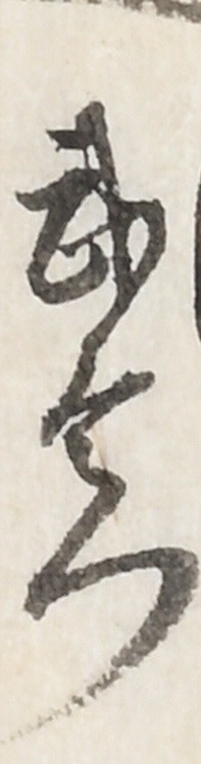太右衛門
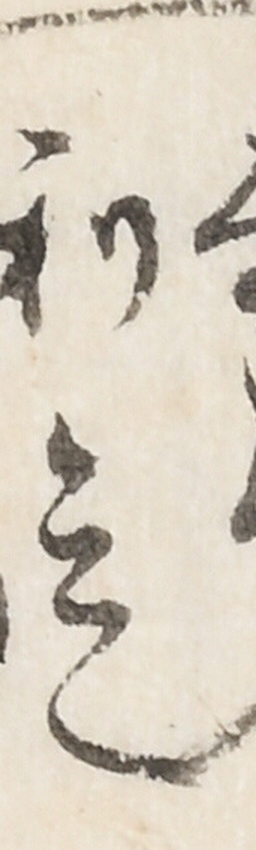利兵衛
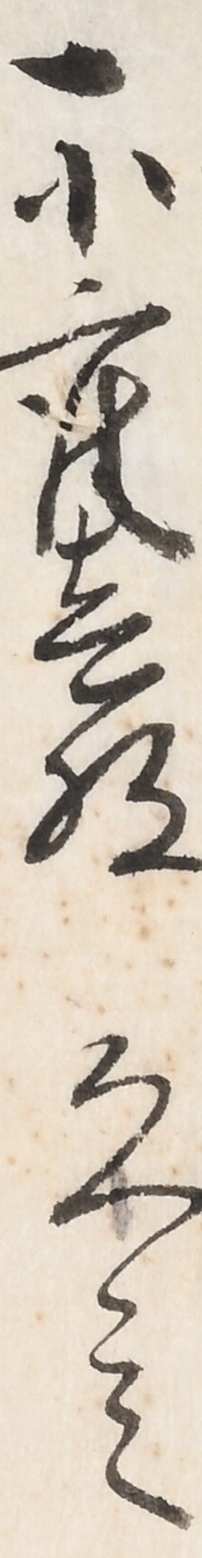一小座壱枚久兵衛
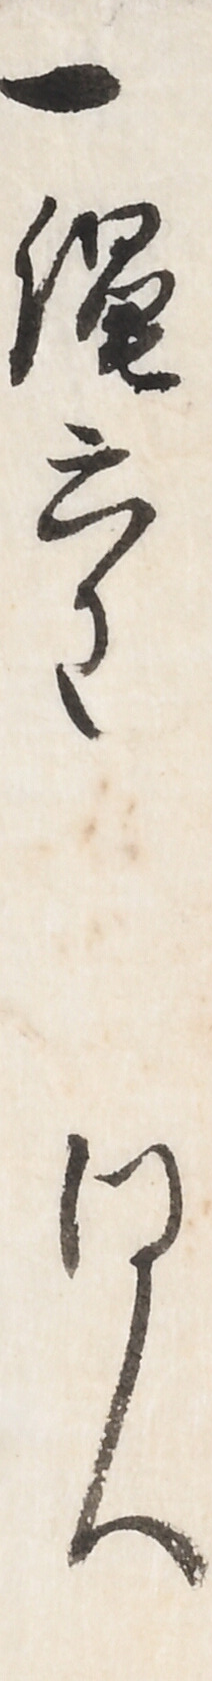一縄六わ同人
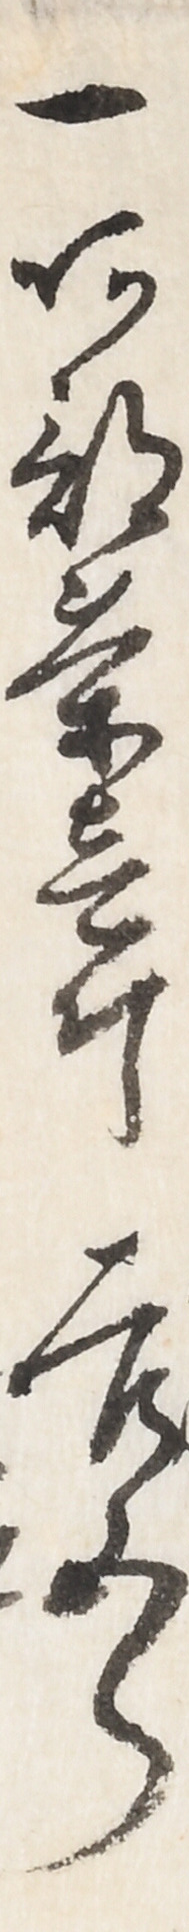一阿部茶壱升庄五郎
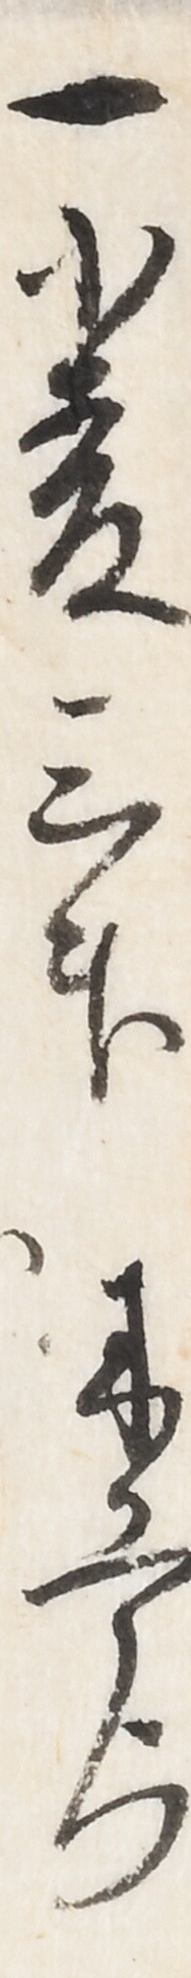一小麦三升杢右衛門
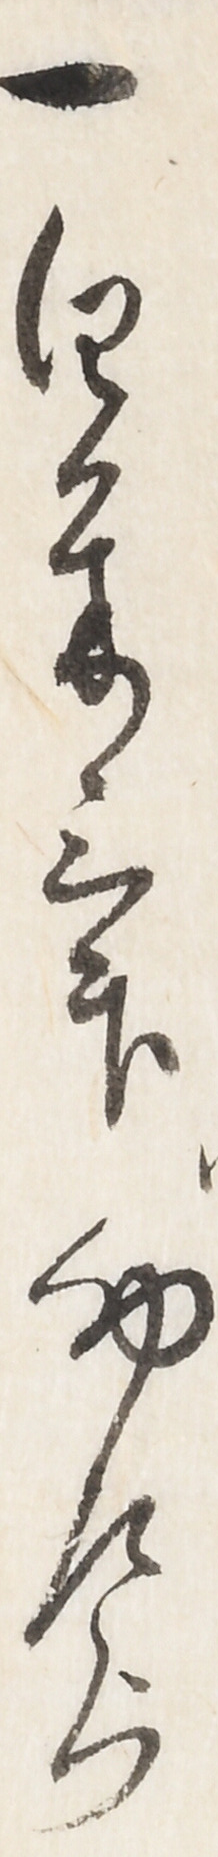一白米三升助左衛門
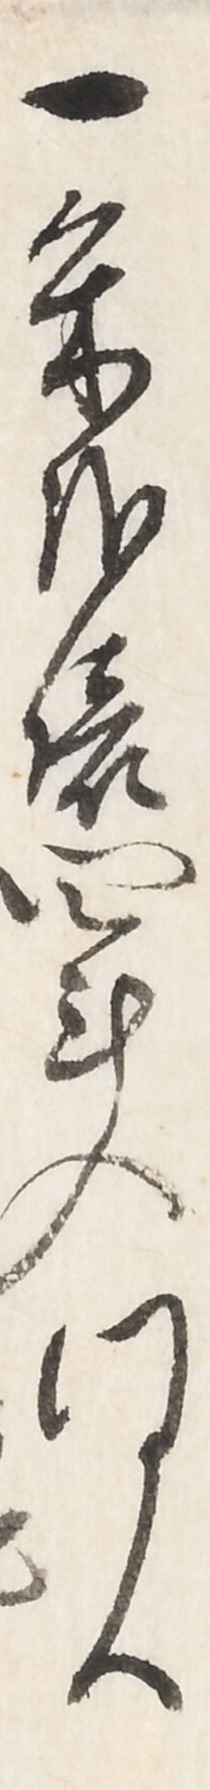一米弐俵四斗入同人
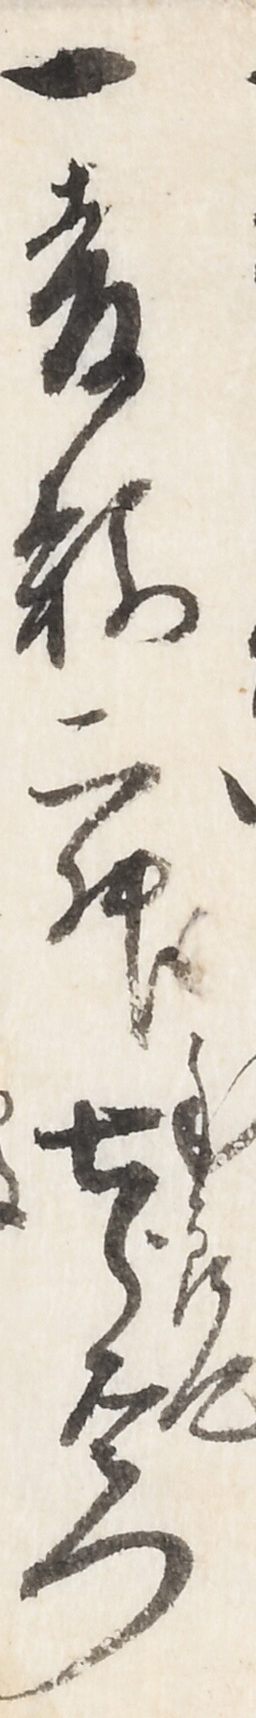一麦粉二升七郎右衛門
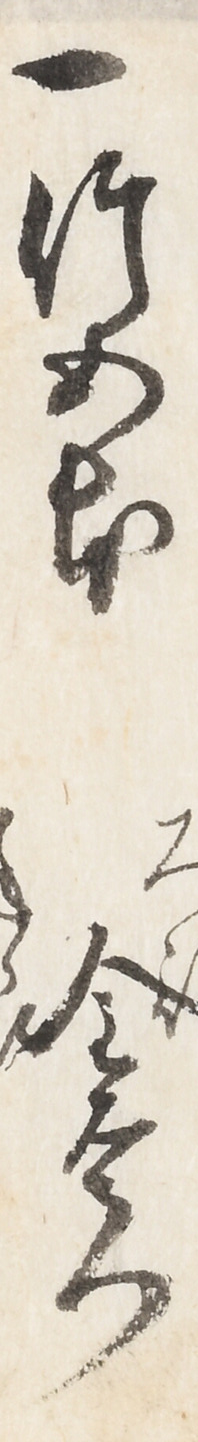一竹五本金右衛門
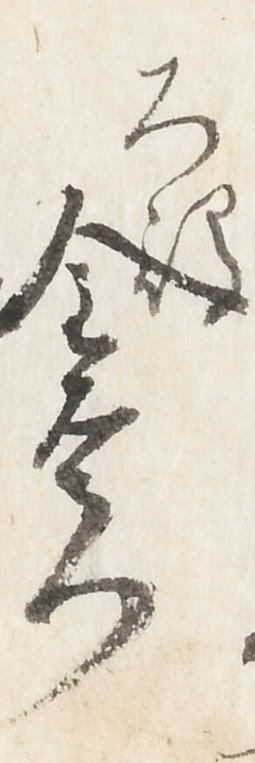太右衛門
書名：合力覚帳
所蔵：伊那市立高遠町図書館・合同会社AMANE
